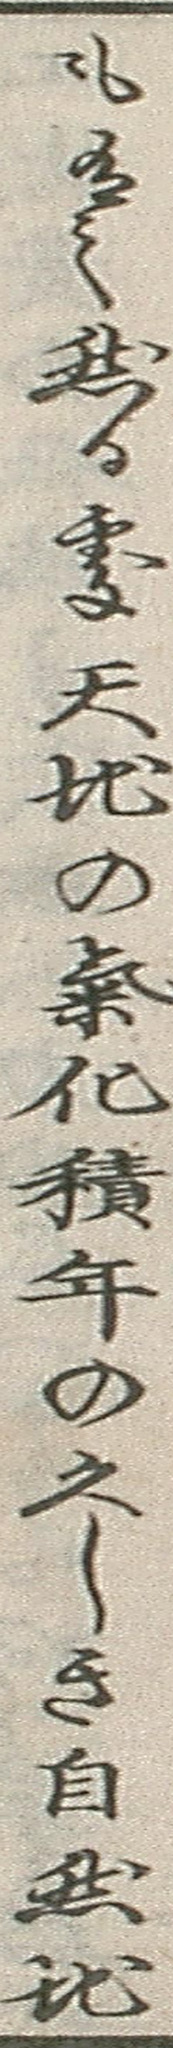も有之然る処天地の気化積年の久しき自然地
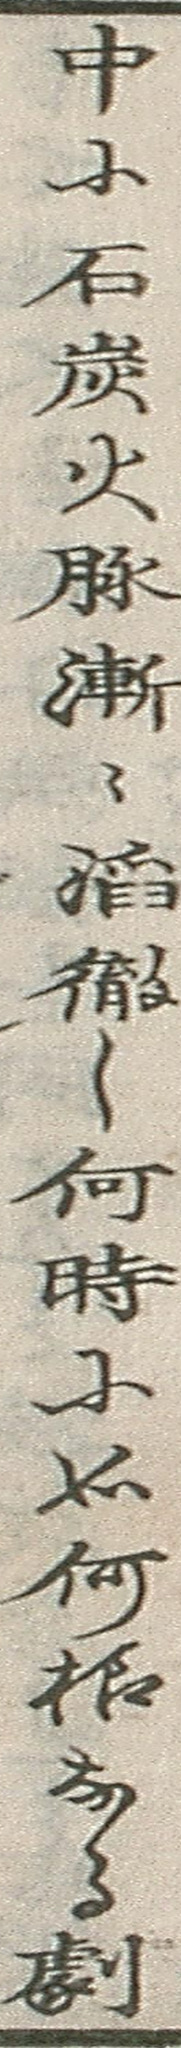中に石炭火脉漸〻滔徹し何時に如何様なる劇
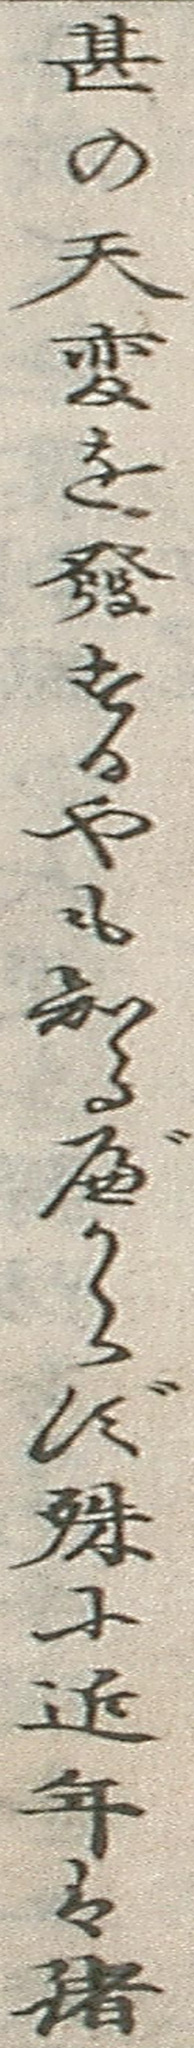甚の天変を発するやも知るべからず殊に近年は諸
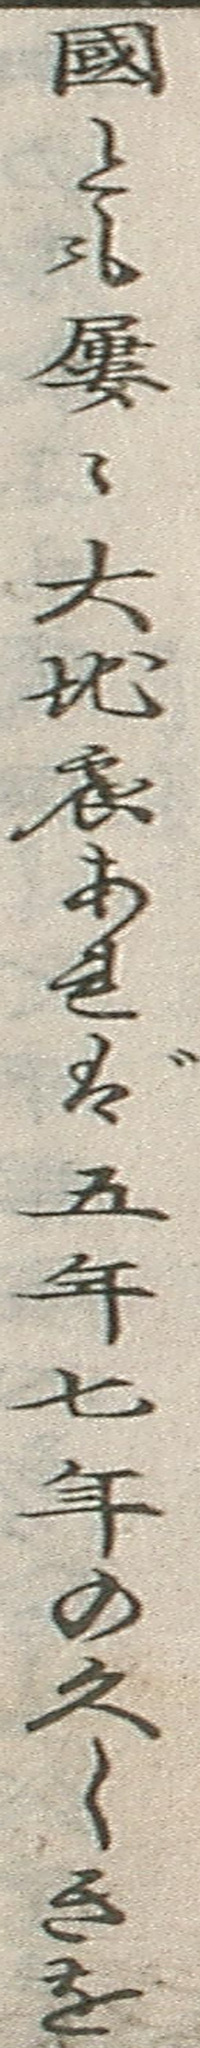国とも屡〻大地震あれば五年七年の久しきを
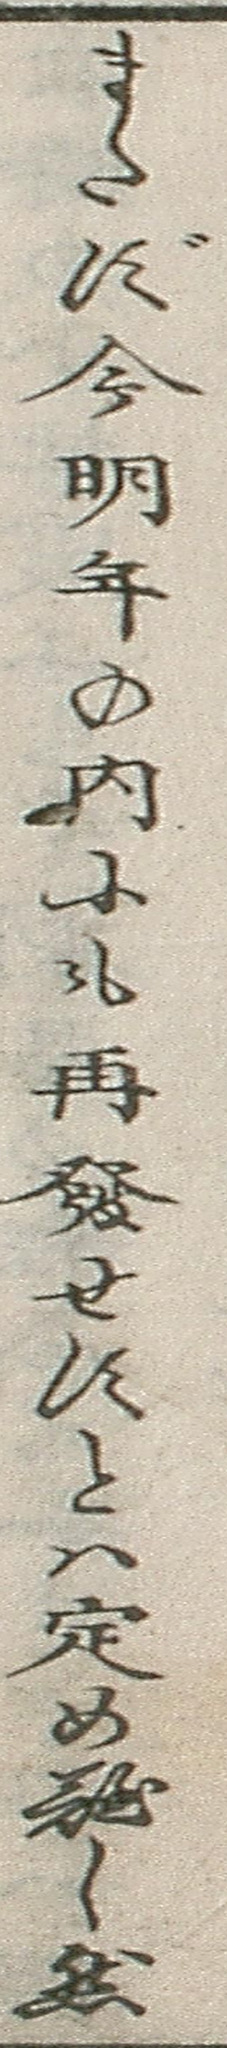またず今明年の内にも再発せすとは定め難し然
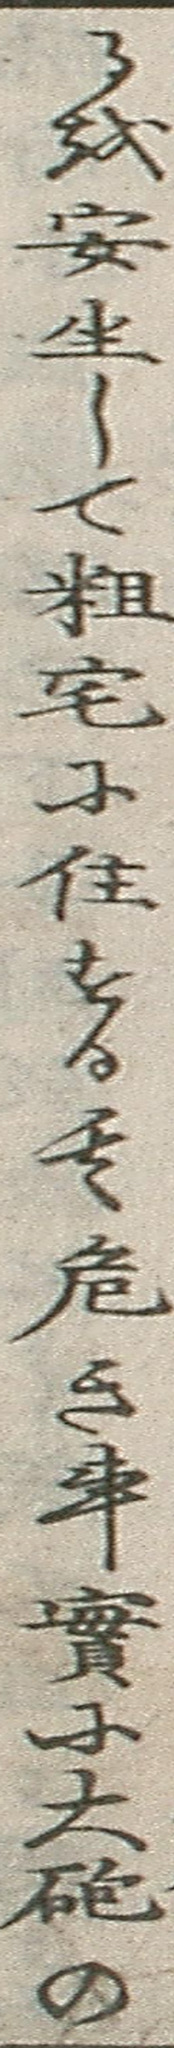るを安坐して粗宅に住する其危き事実に大砲の

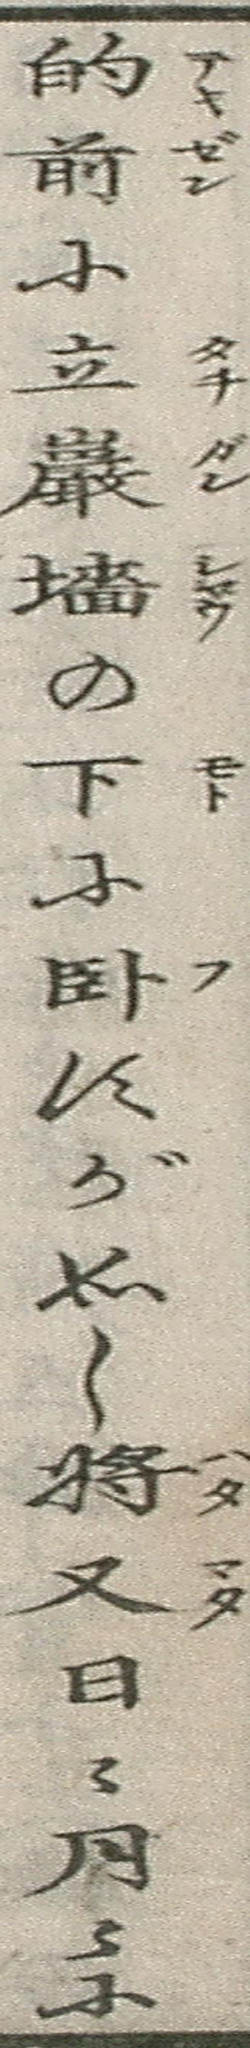的前に立巖牆の下に臥すが如し将又日〻月〻に
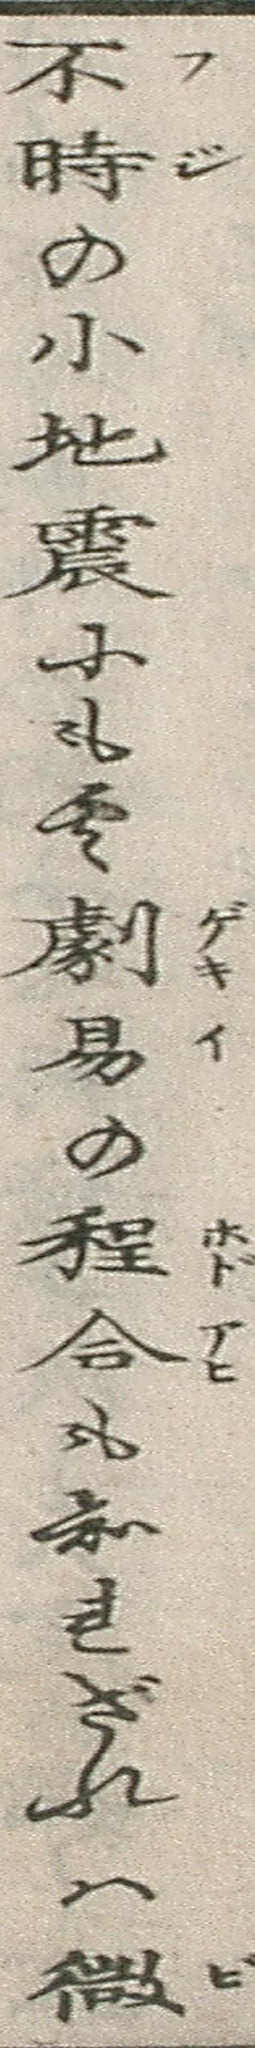不時の小地震にも其劇易の程合も知れざれは微
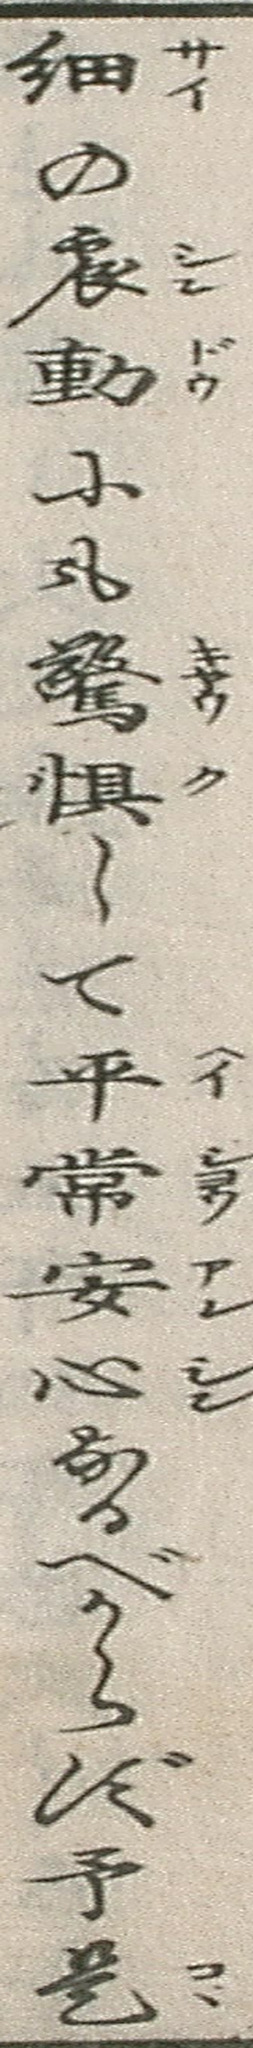細の振動にも驚惧して平常安心なるべからず予是
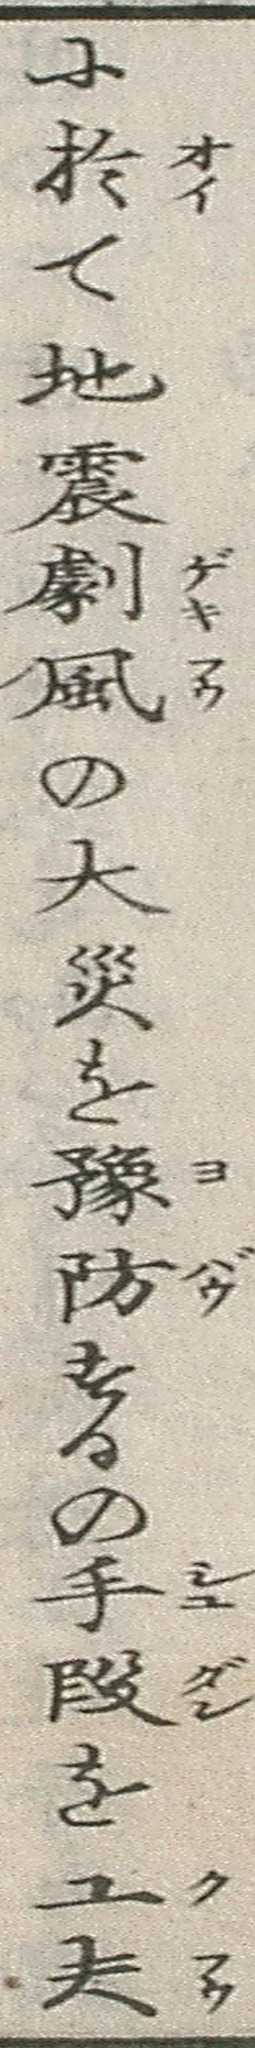に於て地震劇風の大災を予防するの手段を工夫
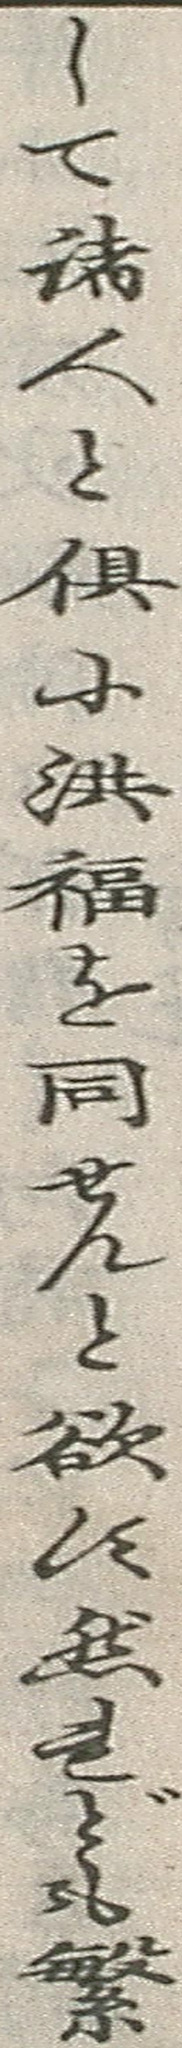して諸人と惧に洪福を同せんと欲す然れども繁
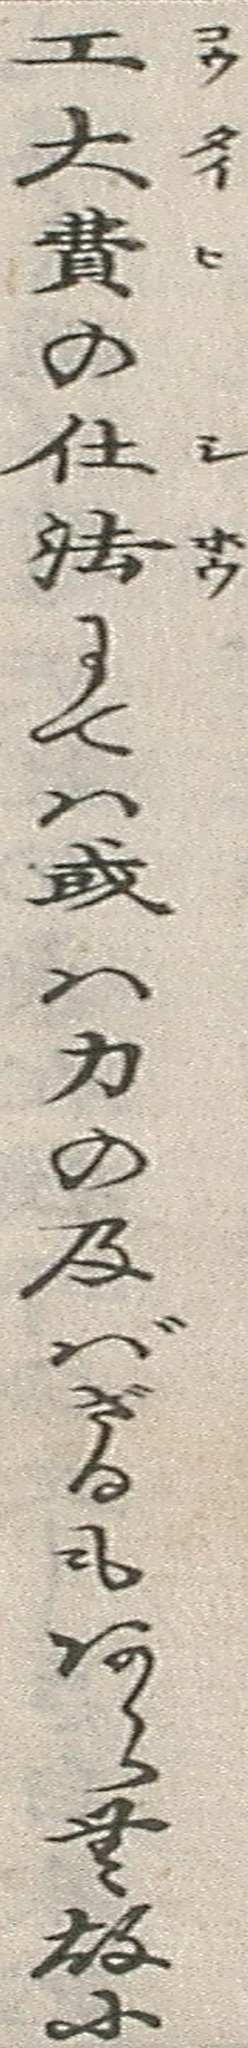工大費の仕法にては或は力の及ばざるもあら無故に
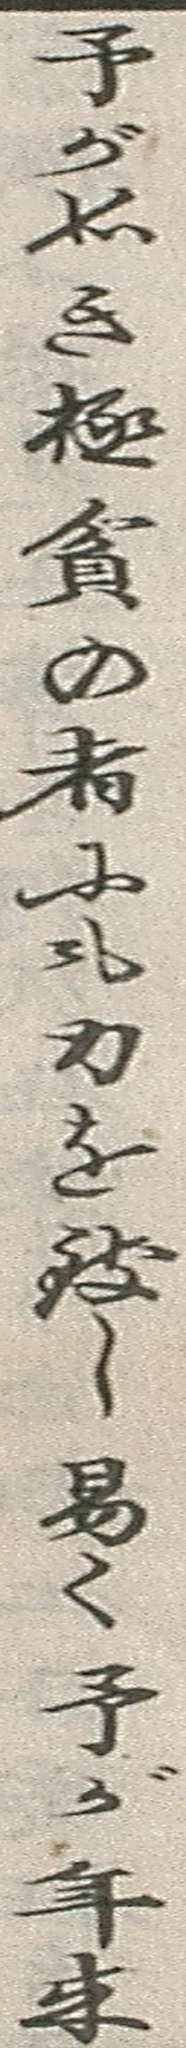予が如き極貧の者にも力を致し易く予が年来
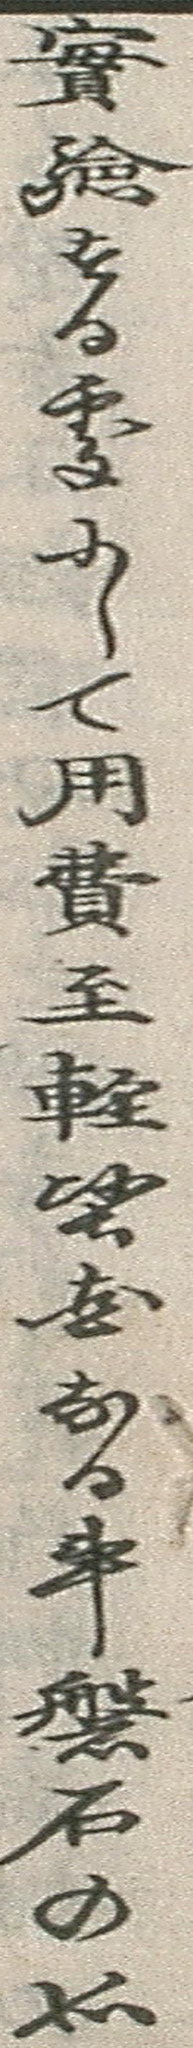実験する処にして用費至軽堅固なる事磐石の如
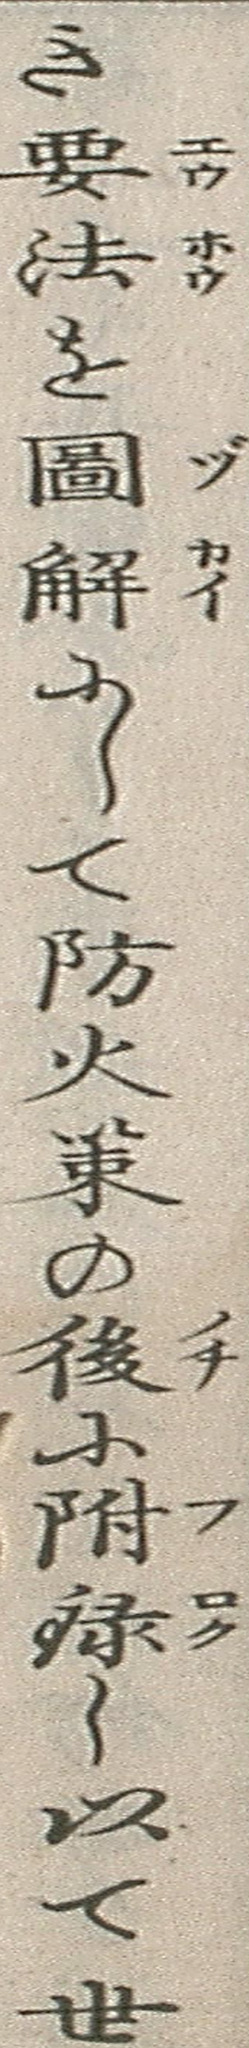き要法を図解にして防火策の後に付録し以て世
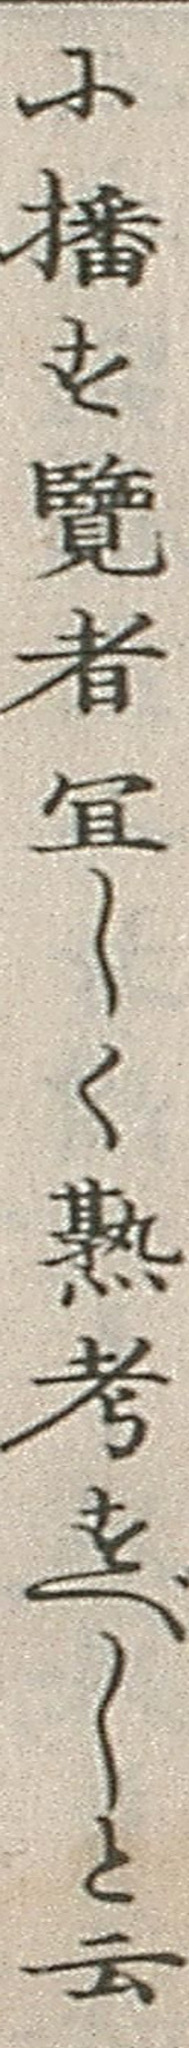に播す覧者宜しく熟考すべしと云
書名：附録　地震劇風災害豫防法圖説（内題）
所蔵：東京大学地震研究所図書室 Earthquake Research Institute Library, The University of Tokyo, JAPAN
